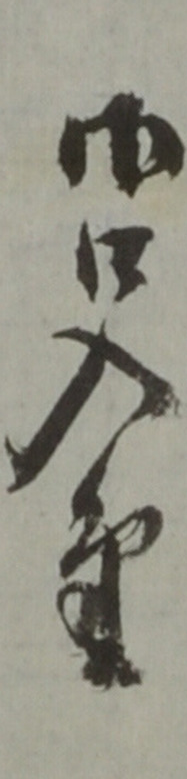御口入金
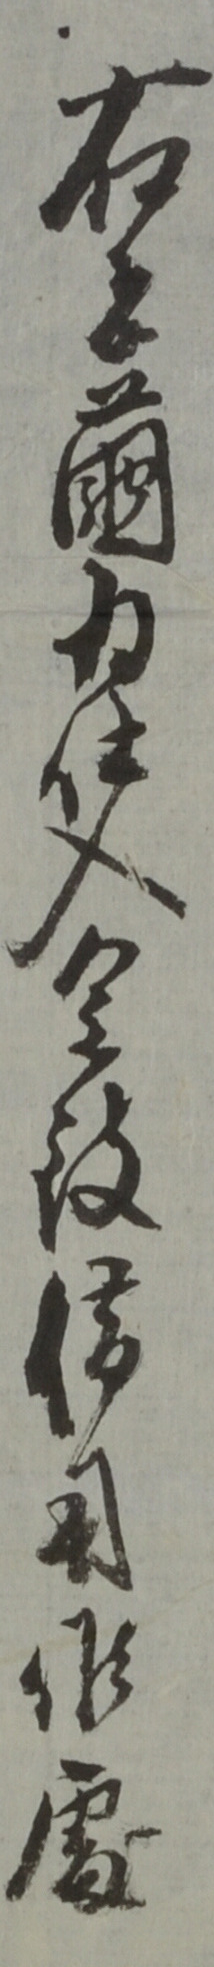右は繭為仕入金致借用候処
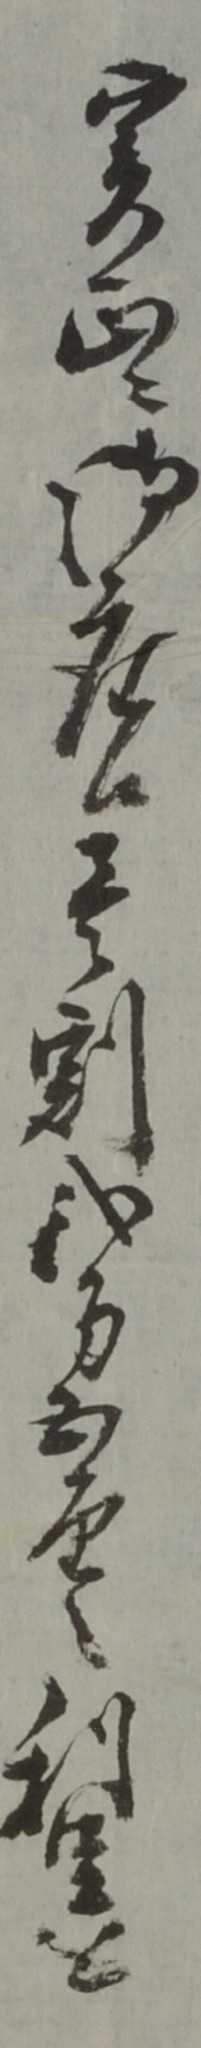実正ニ御座候壱割弐分五厘之利足を
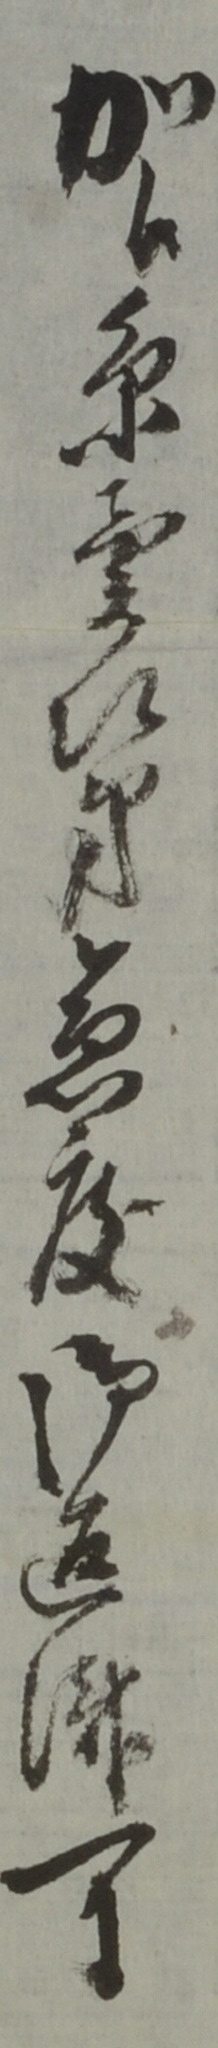加江糸売次第急度御返済可
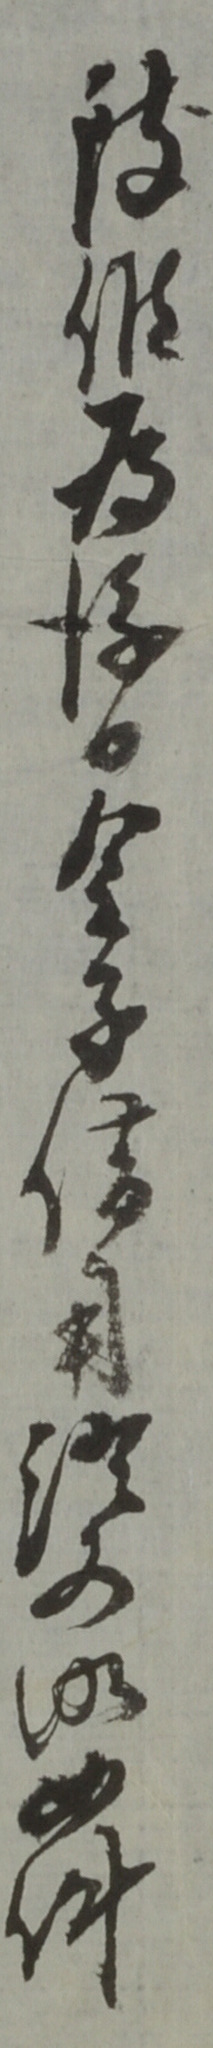致候為後日金子借用証文仍如件
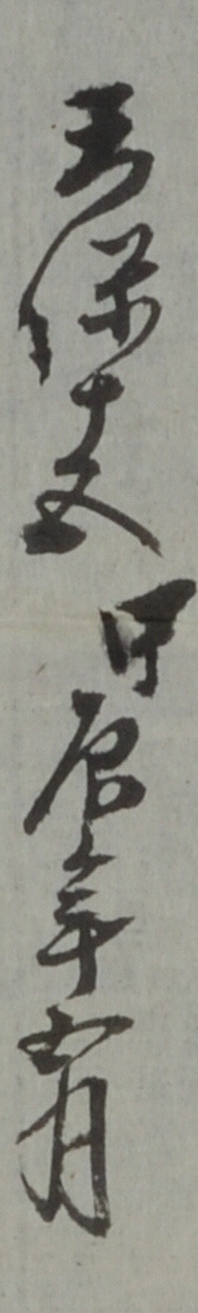天保十五甲辰年五月
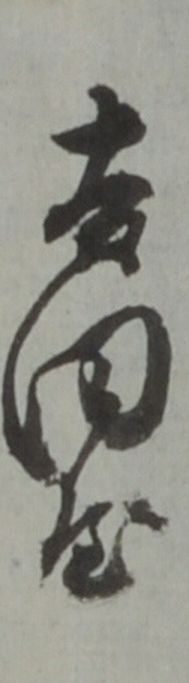吉田屋
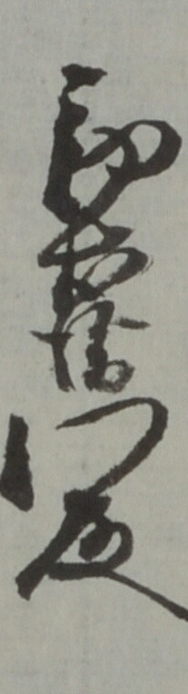勘右衛門殿
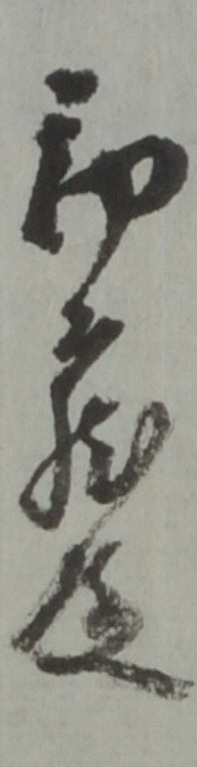勘蔵殿

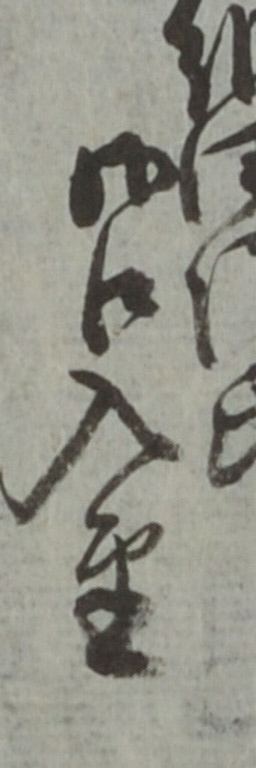御口入金
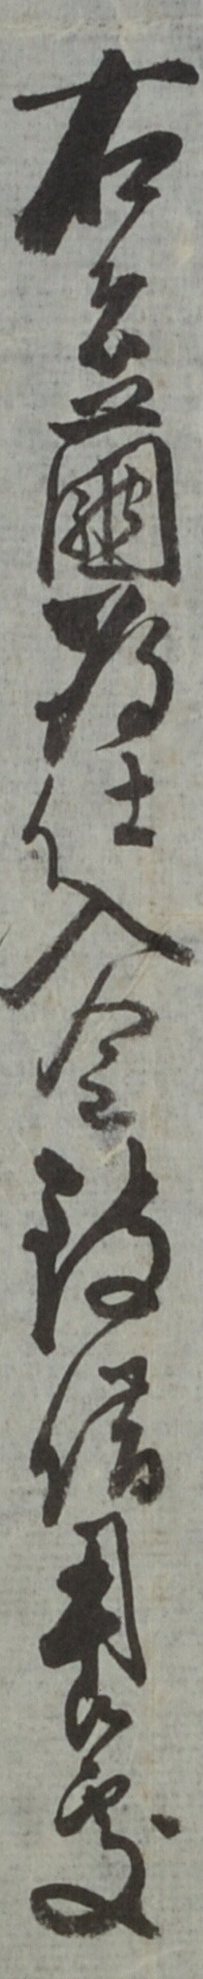右は繭為仕入金致借用候処
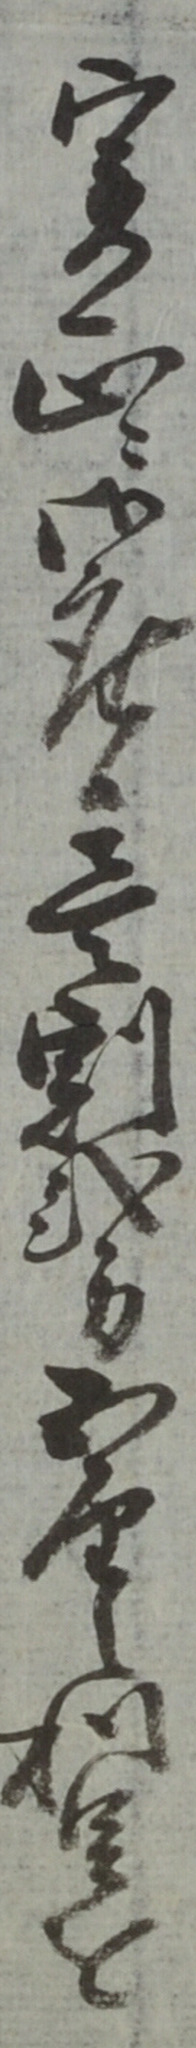実正ニ御座候壱割弐分五厘之利足を
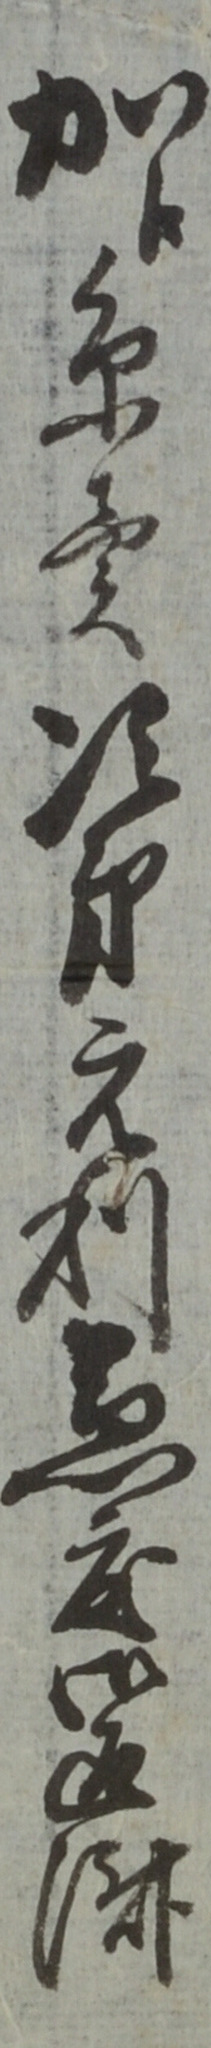加江糸売次第元利急度御返済
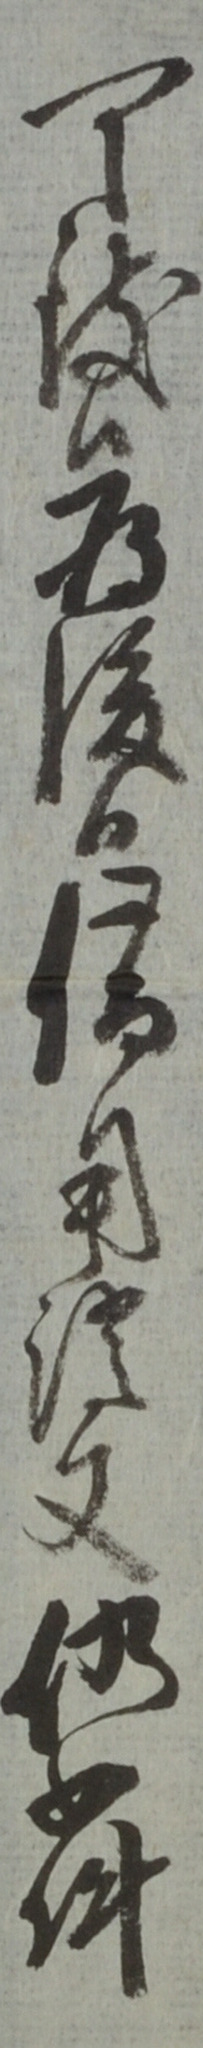可致候為後日借用証文仍如件
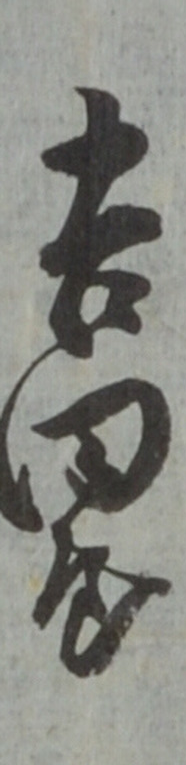吉田屋
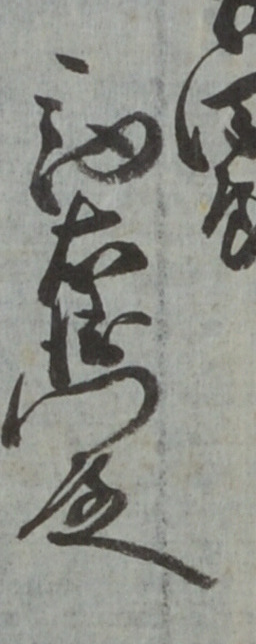勘右衛門殿
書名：拝借證文之事
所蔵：伊那市立高遠町図書館・合同会社AMANE
